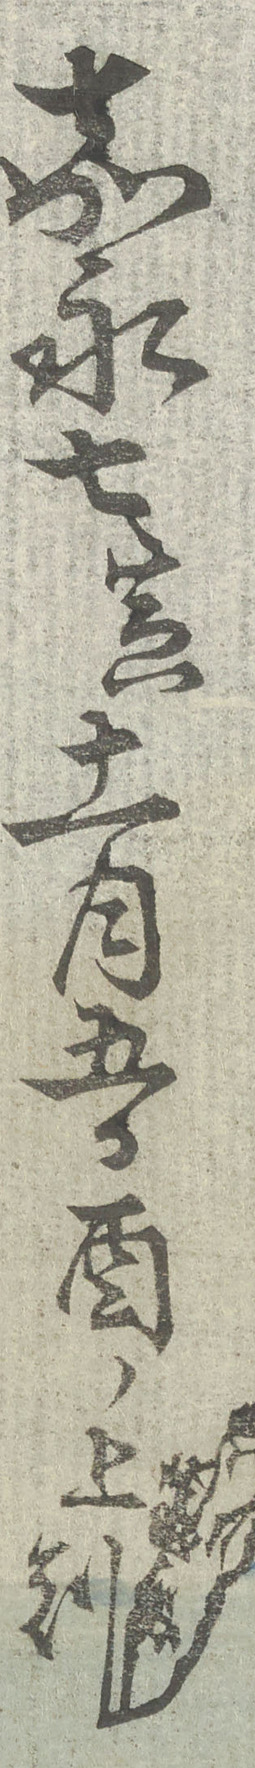嘉永七寅十一月五日酉ノ上刻
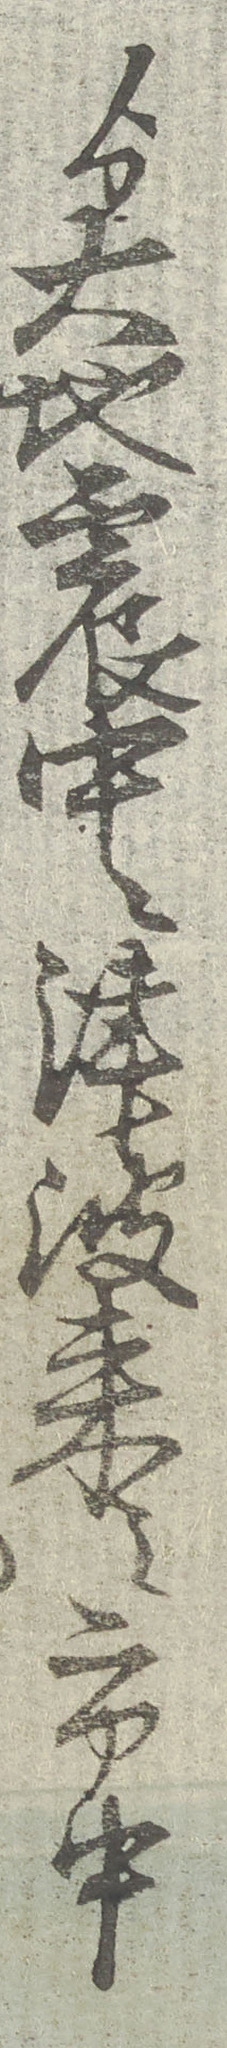ゟ大地震中に津波来て市中
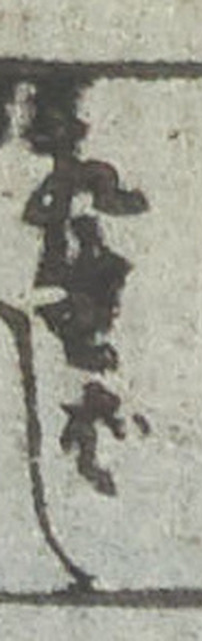相生ばし
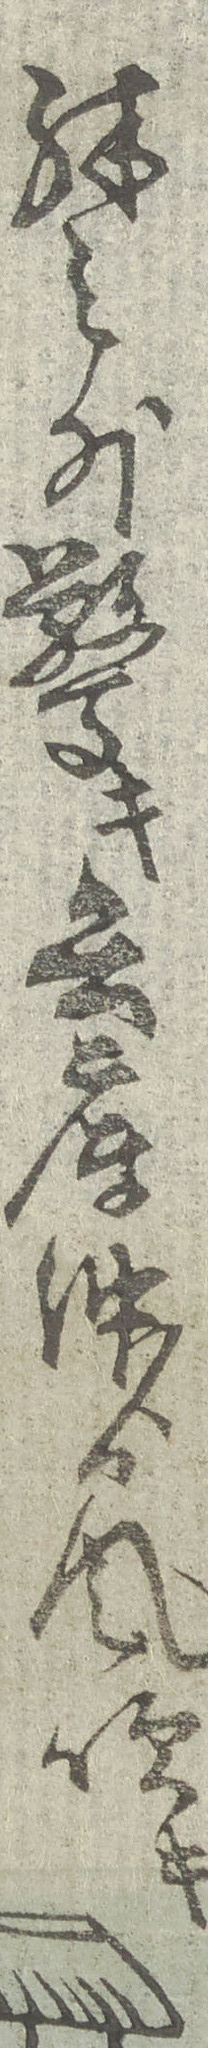殊の外驚き兵庫沖ゟ風吹き
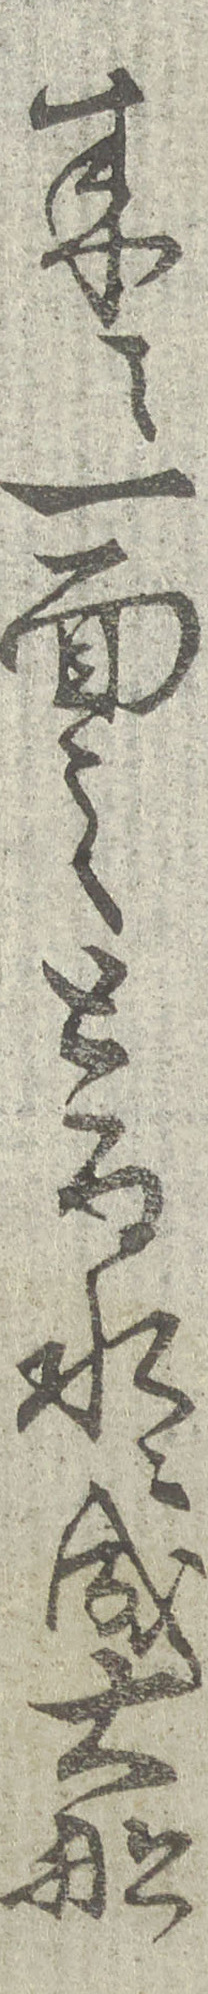来て一面のとろ水に成大船
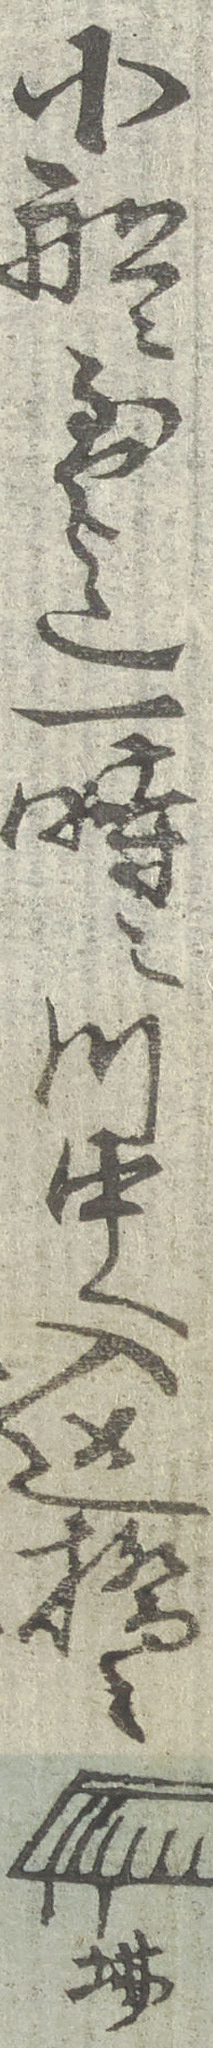小船に至迄一時に川中へ入込橋々
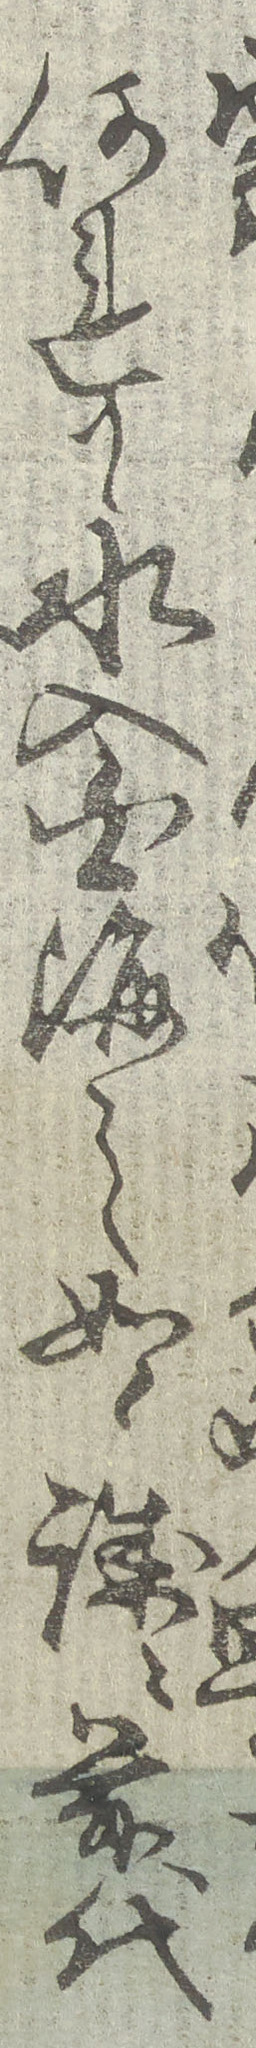何れも水入白海の如し誠に前代死人
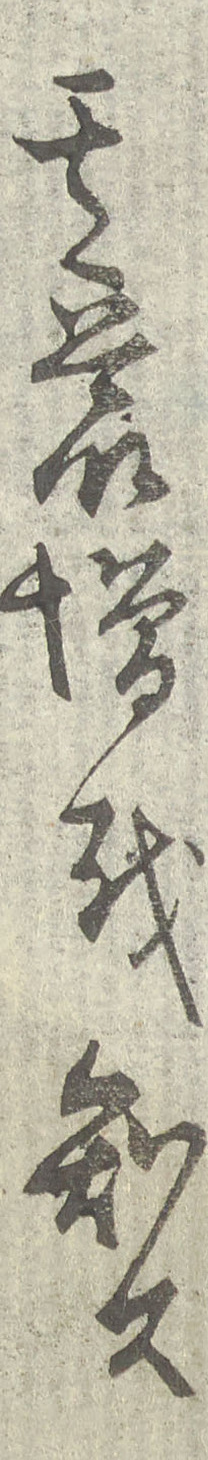其荒増を知す
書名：泉州堺津波之絵図
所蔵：東京大学総合図書館 General Library in the University of Tokyo, JAPAN
